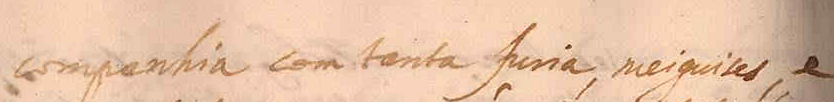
companhia com tanta furia, meiguices, e
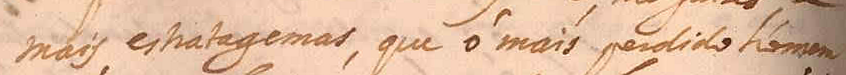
mais, estratagemas, que ó mais perdido homem
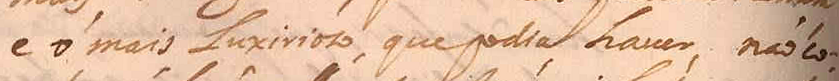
e ó mais Luxirioso, que podia hauer, naõ co
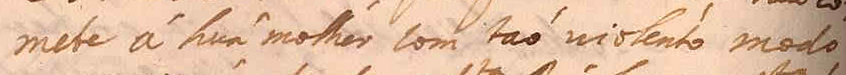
mete á huā molher com taõ uiolento modo,
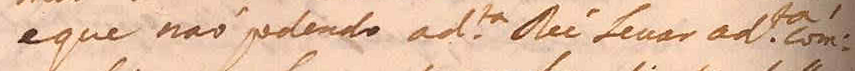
e que naõ podendo a d.ta Reé leuar a d.ta com
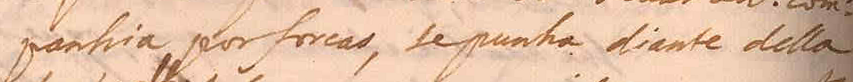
panhia por forças, se punha diante della
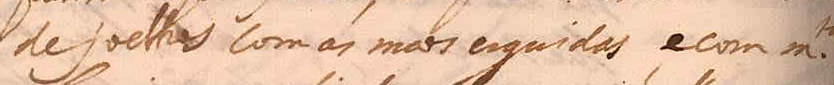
de joelhos com as maos erguidas, e com m.tas
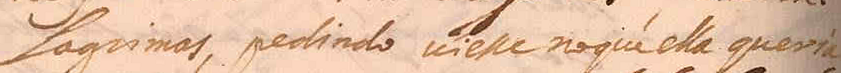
Lagrimas, pedindo uiesse no que ella queria
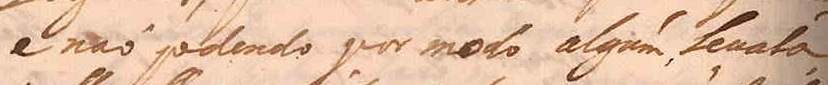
e naõ podendo por modo algum, leuala,
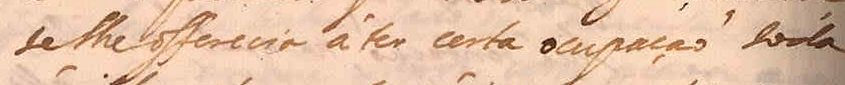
se lhe offerecia á ter certa ocupaçaõ toda
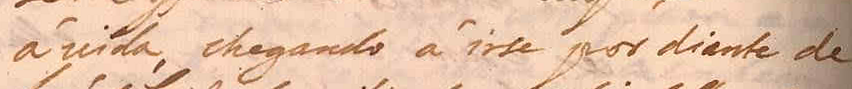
á uida, chegando á irse por diante de
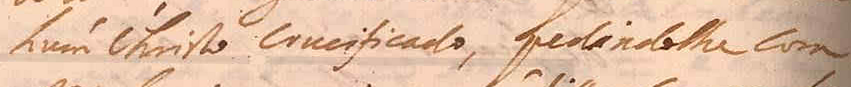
hum Christo crucificado, pedindolhe com
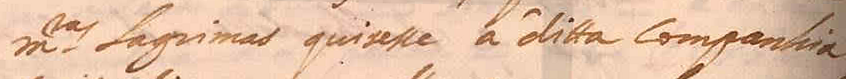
mtas Lagrimas quizesse a ditta Companhia
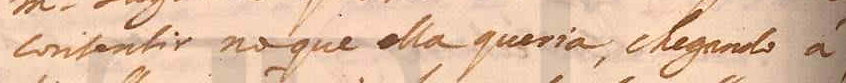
consentir no que ella queria, chegando á
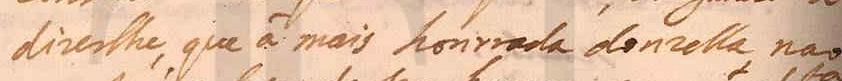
dizerlhe, que á mais honrrada donzella naõ
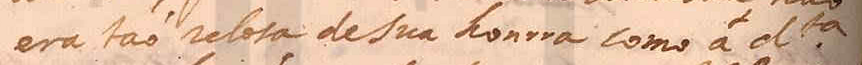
era taõ zelosa de sua honrra como á dta
